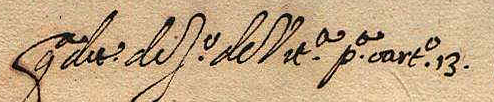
ꝯadit. de Jo de Vit.a p.a o arto. 13.
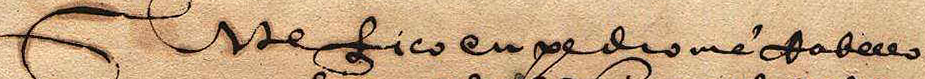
Sertefico eu pedromē Rabello
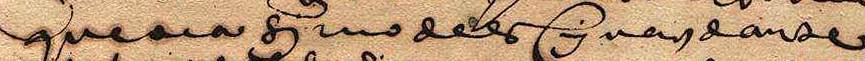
que ora sjruo de esCrjuaõ dante
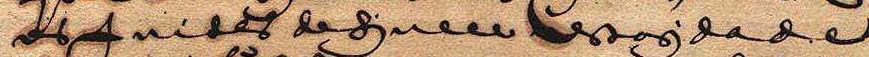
os Juises do sjuell desta sjdade
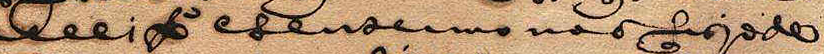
de llixa e seu termo no oficjo de
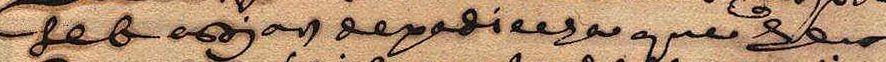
sebastjaõ de padillha que hora
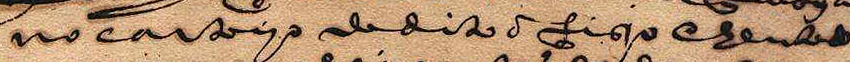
no cartorjo do dito ofisjo e hen todo
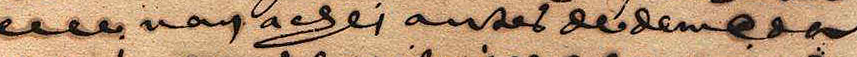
elle naõ achei autos de demāda
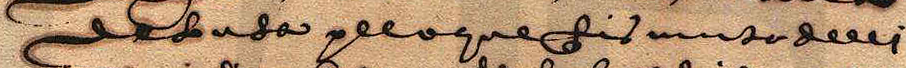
de sousa pelo que fis muta delli
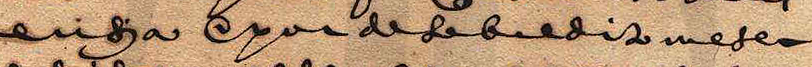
gensja e por do sobredito me ser
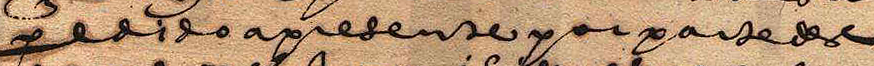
pedido a presento por parte dos
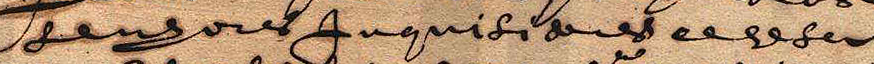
senhores Jnquisidores he ser
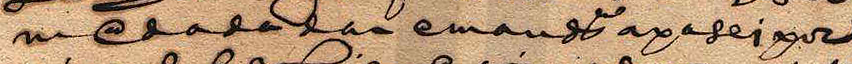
mādada dar em audja a pasei por
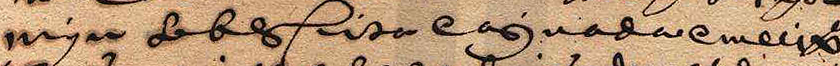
myn sobesCrita e asjada em llixa
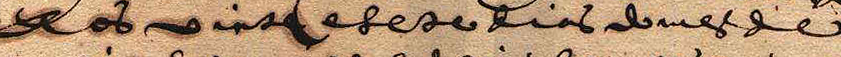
Aos vinte e sete dias do mes de
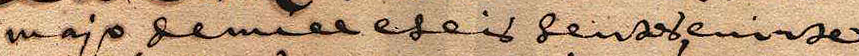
majo de mill e seissentos e uinte
